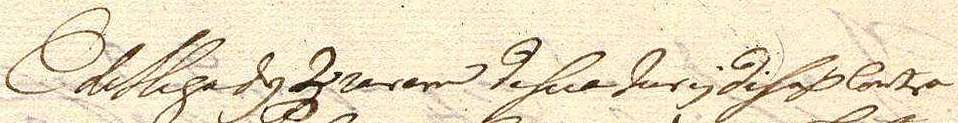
E dellegados dizarem de sua Iurisdisaõ Contra
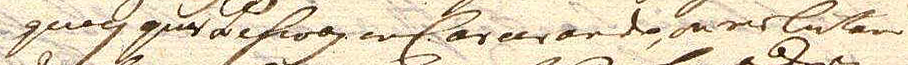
quaesquer pessoas enCarcerando, ou reCutam
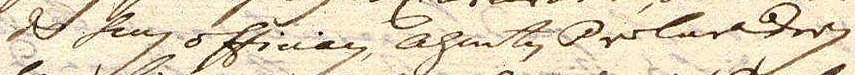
do seus officiaes, agentes ProCuradores
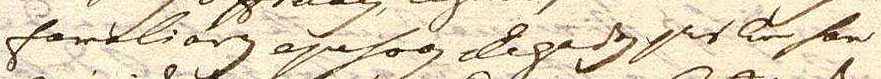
familiares e pesoas chegados por Comsan
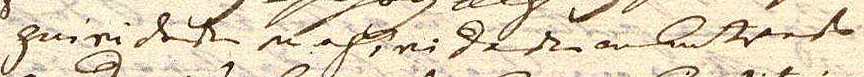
guinidade ou afinidade ou Contrato
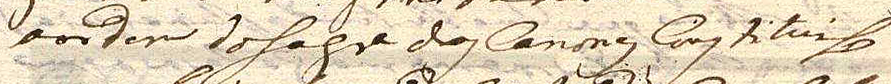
a ordem do sagrados Canones Constituiso
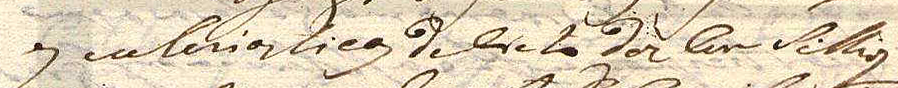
es eccleziasticas deCreto dos ConSillios
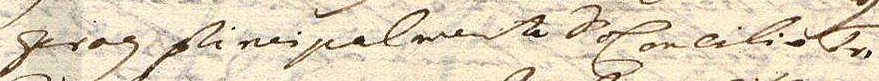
geraes pRincipalmente Do Concilio Tri
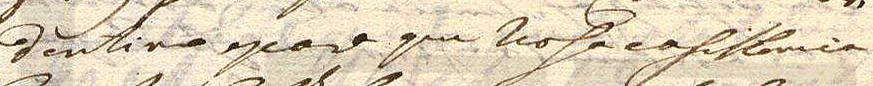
dentino e para que Vosa exsellencia
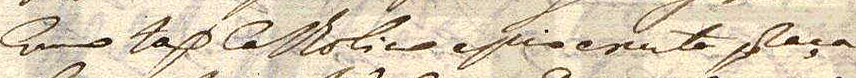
Como taõ Catholico e pio e nesta pRaça
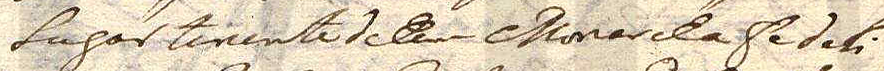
Lugar tenente de hum Monarcha fedeli
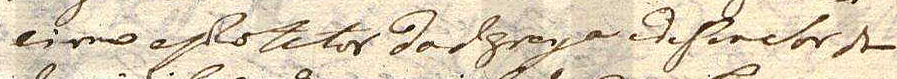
cimo e pRotetor da Igreya e de senhor de
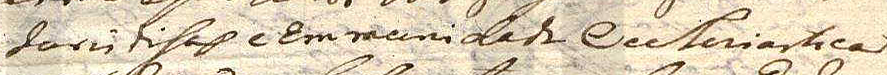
Iurisdisaõ e Emmunidade eccleziastica
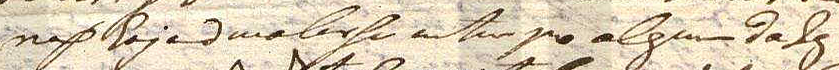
naõ hoje de ualerse en tempo algum da Ig
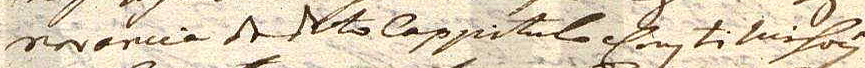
norancia do dito Cappitulo e Constituisoẽs
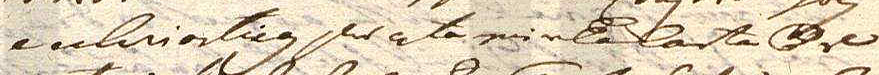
eccleziasticas por esta minha Carta Pre
